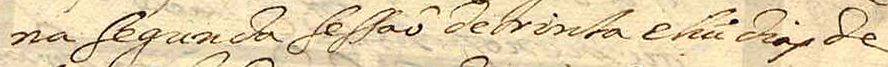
na segunda sessaõ de trinta e hū dias de
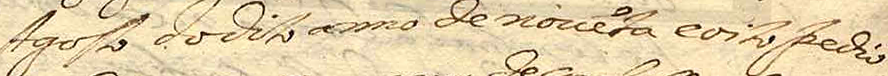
Agosto do dito anno de nouēta e oito pedio
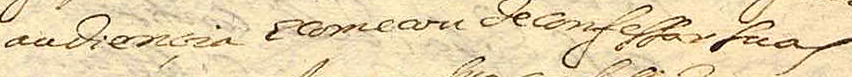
audiençia e comecou de confessar suas
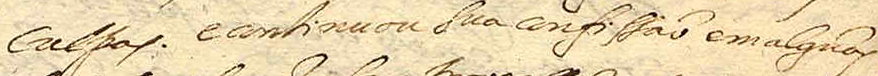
culpas. e continuou sua confissaõ em algūas
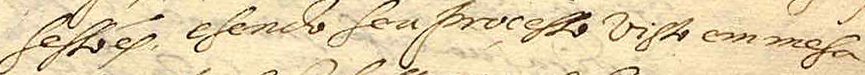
sessões, e sendo seu proçesso visto em mesa
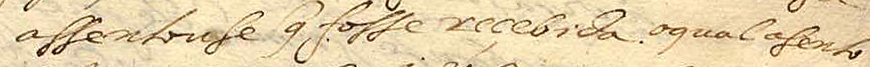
assentouse q̄ fosse reçebida o qual asento
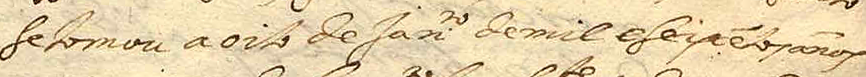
se tomou a oito de Jan.ro de mil e seiscētos an̄os
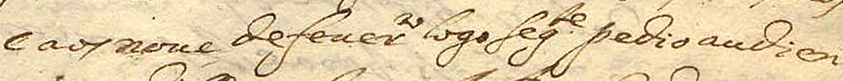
e aos noue de feuerro logo seg.te pedio audien
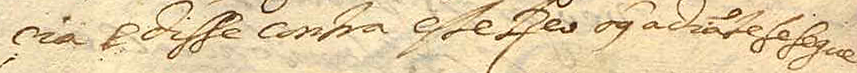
çia E disse contra este Reo o q̄ adiāte se segue
